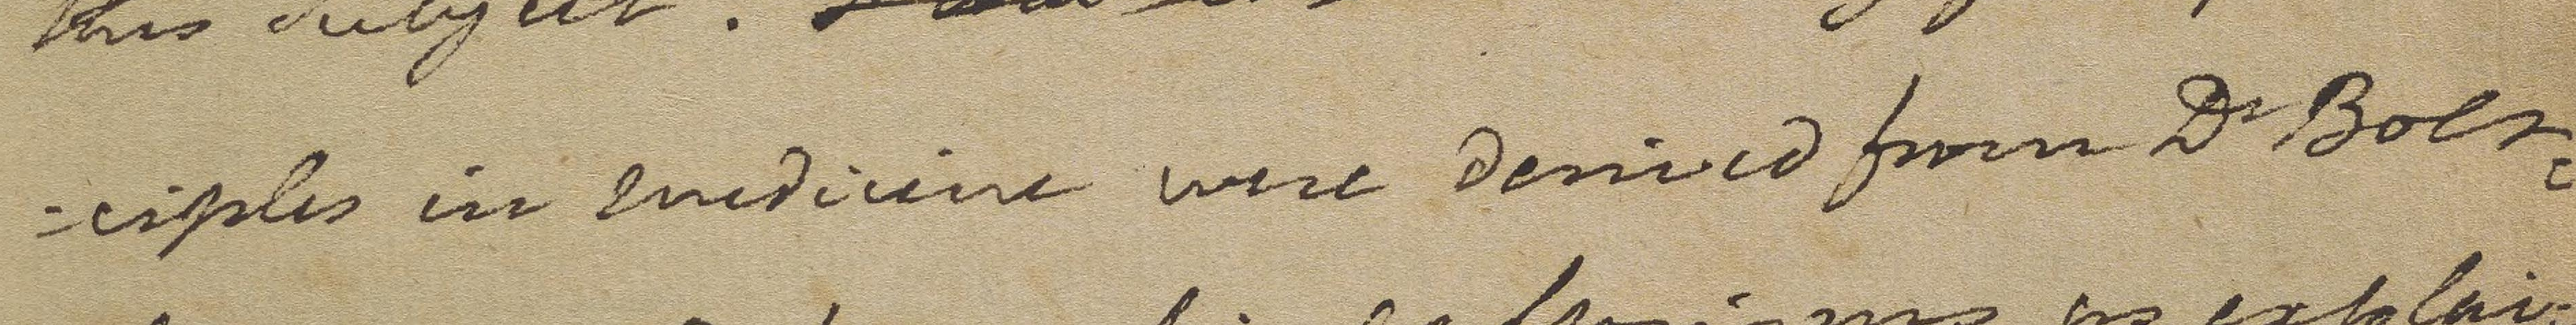-ciples in evidence were derived from D^r Boer-
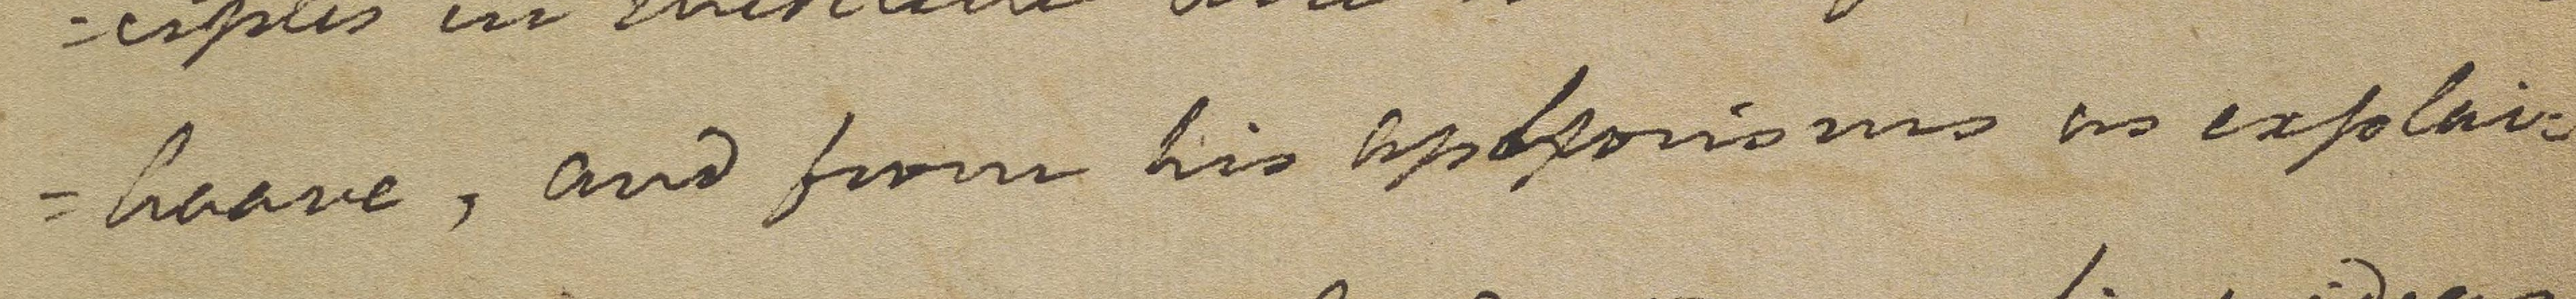-haave, and from his aphorisms as explai-
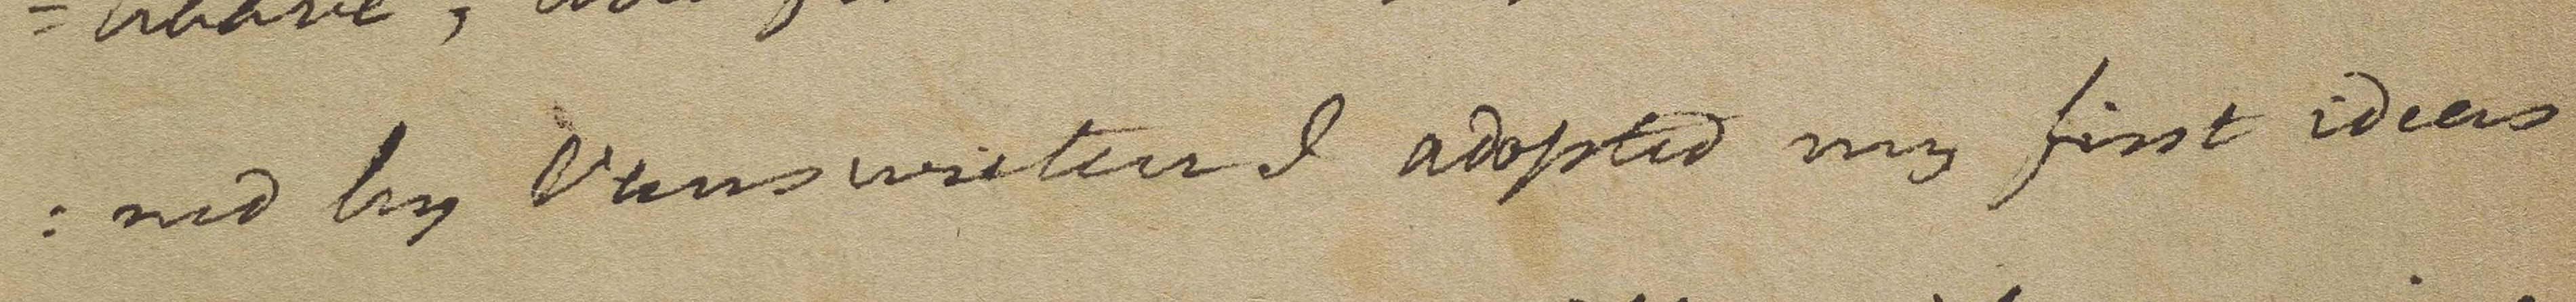-ned by this writer I adopted my first ideas
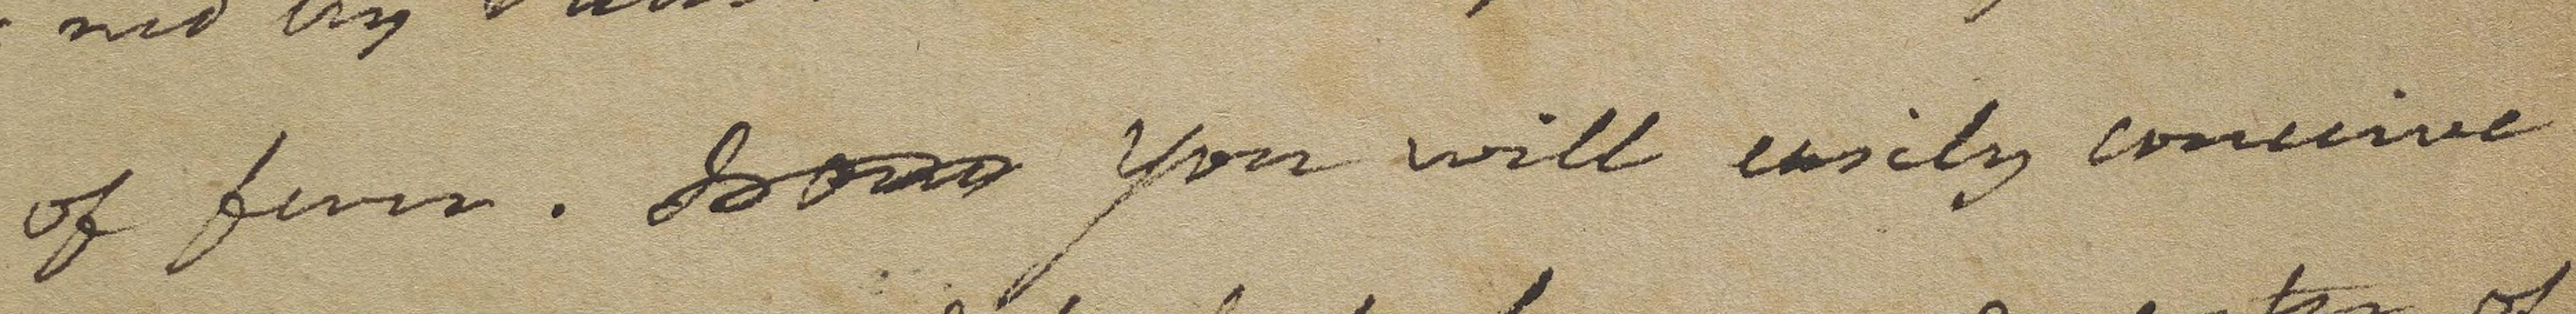of fever. [I am] You will easily conceive
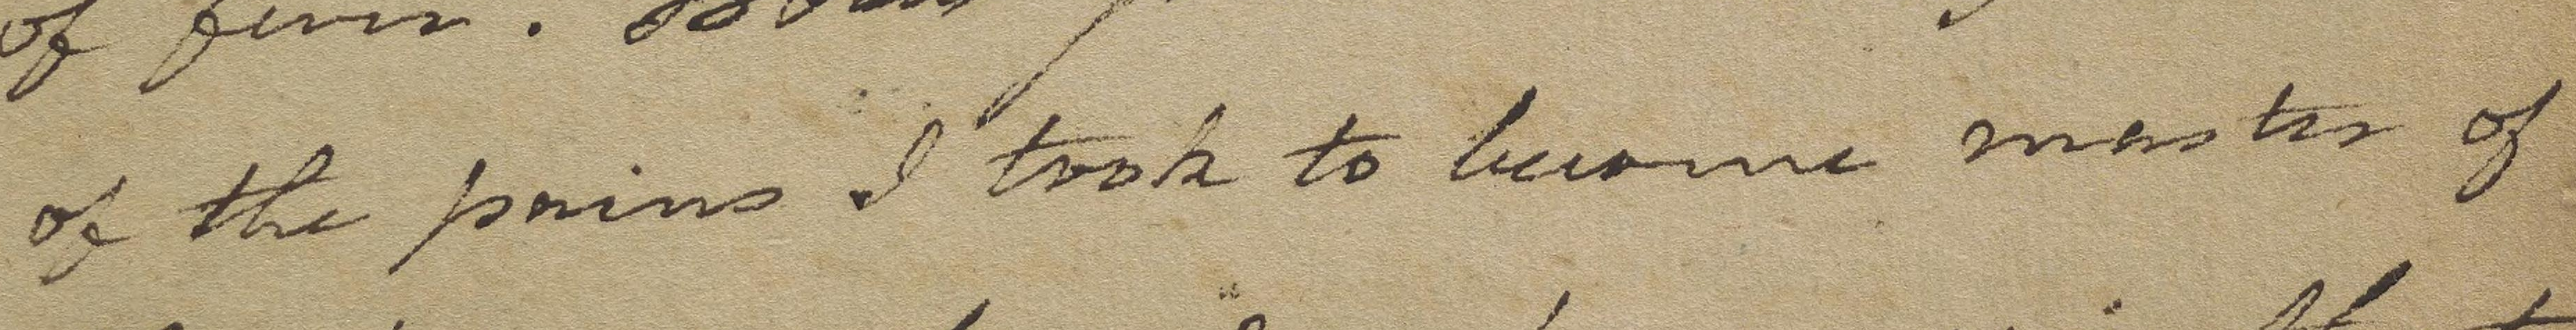of the pains I took to become master of
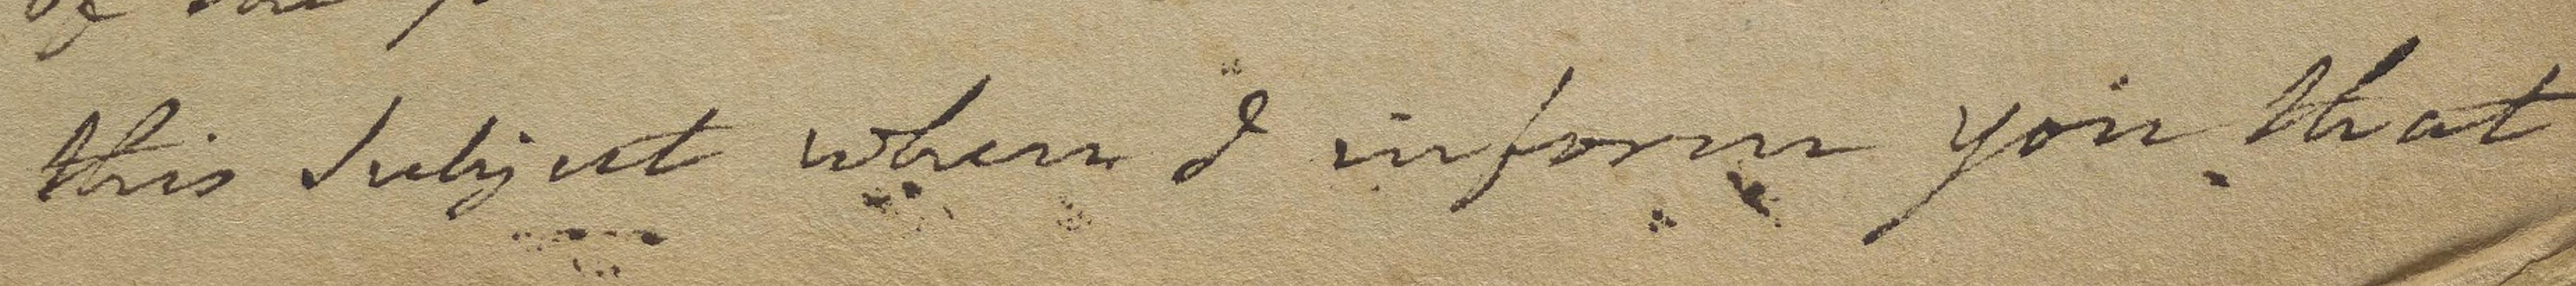this subject when I inform you that
